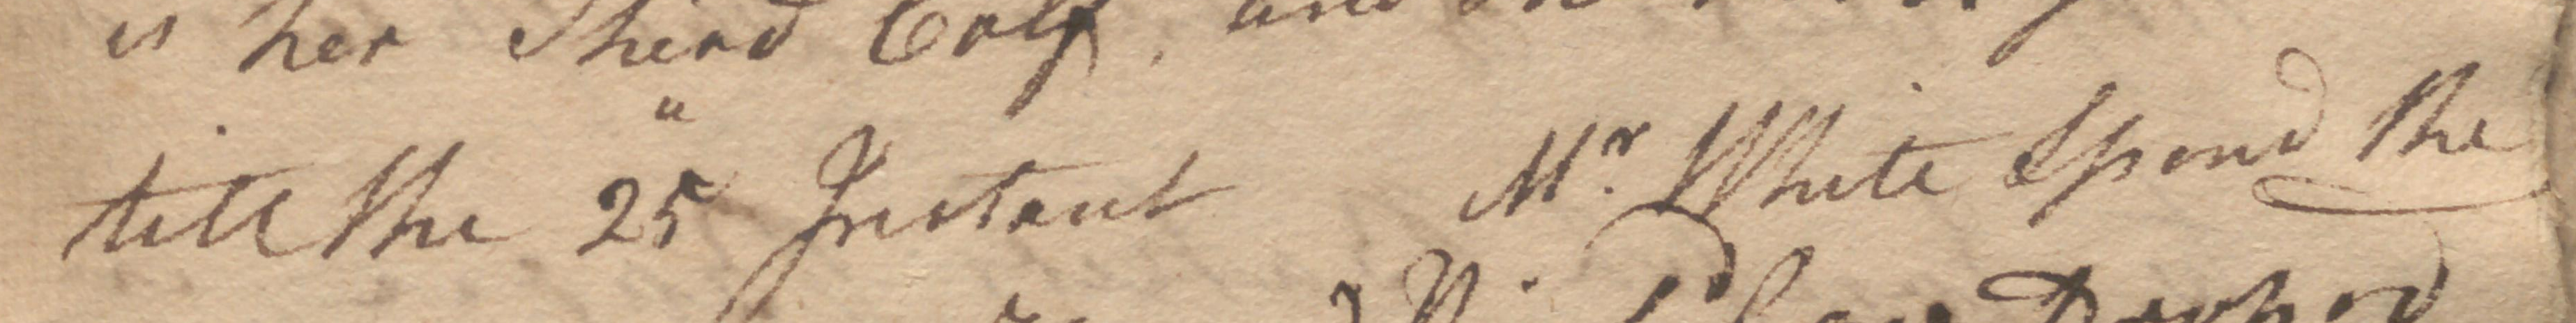till the 25 Instant M^r. White spend the
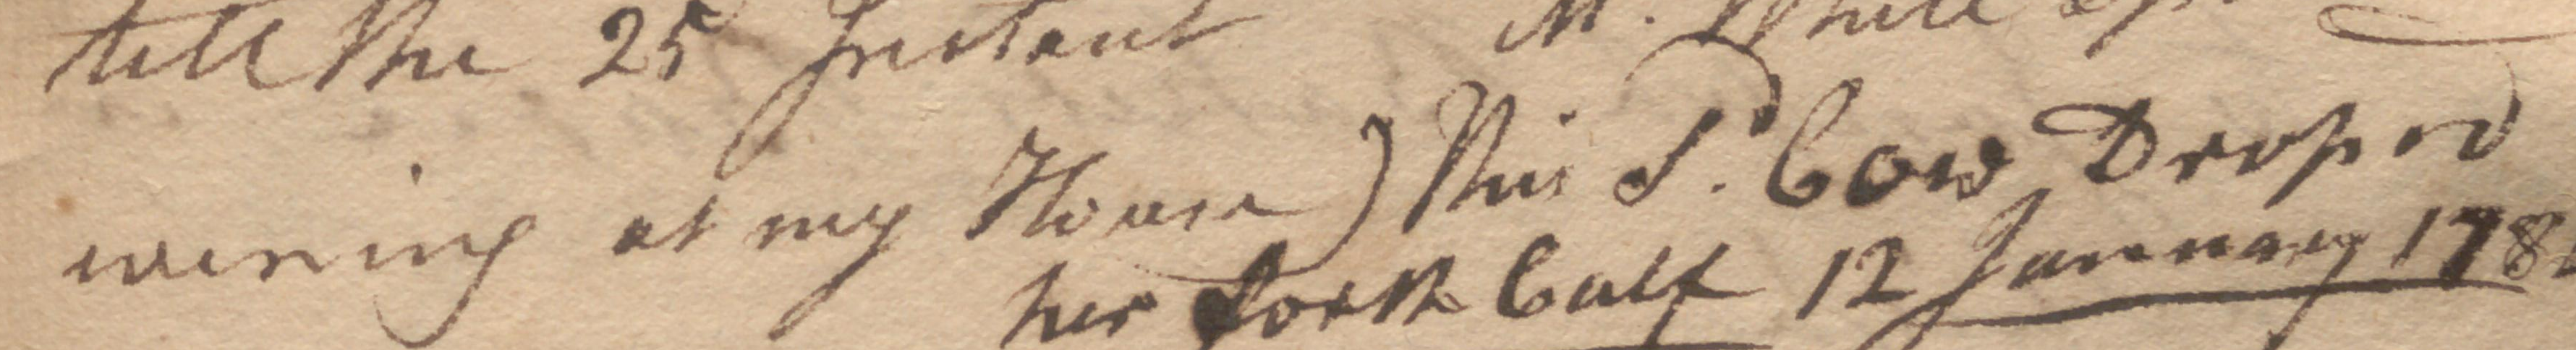evening at my House) this s^d. Cow, Droped
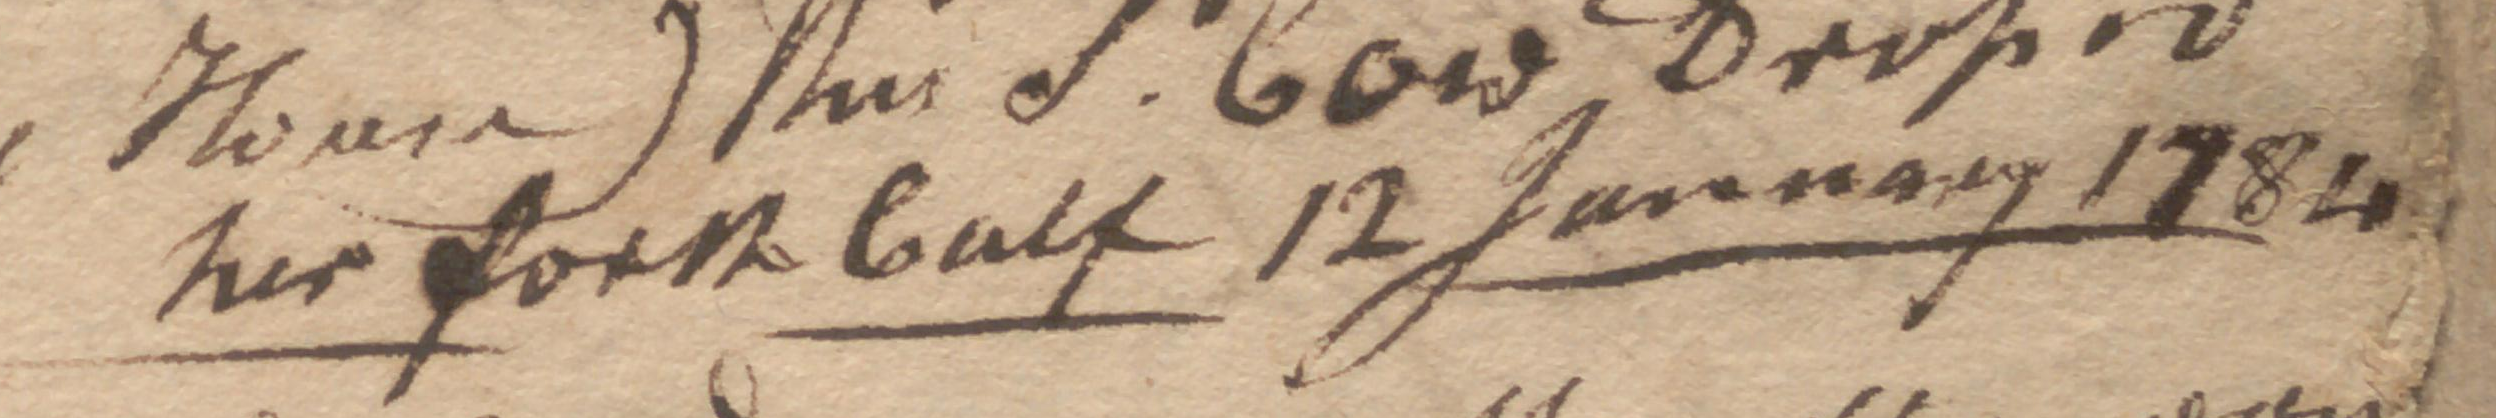her forth Calf 12 Jannany 1784
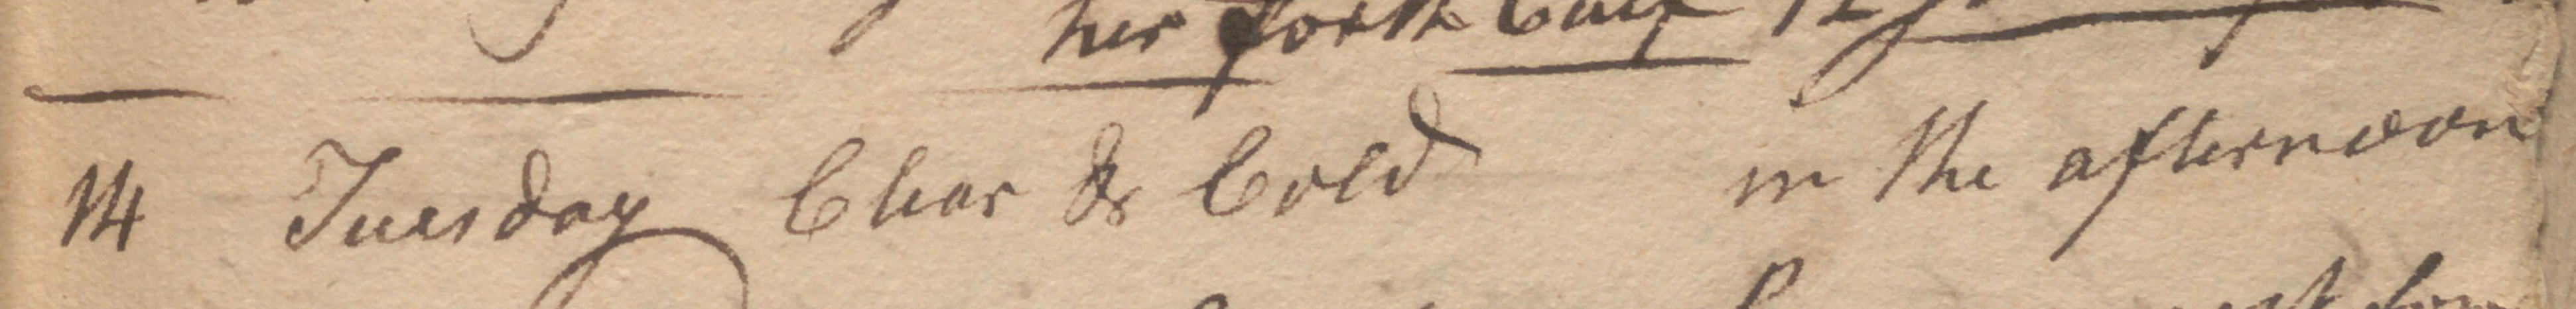14 Tuesday Clear & Cold in the afternoon
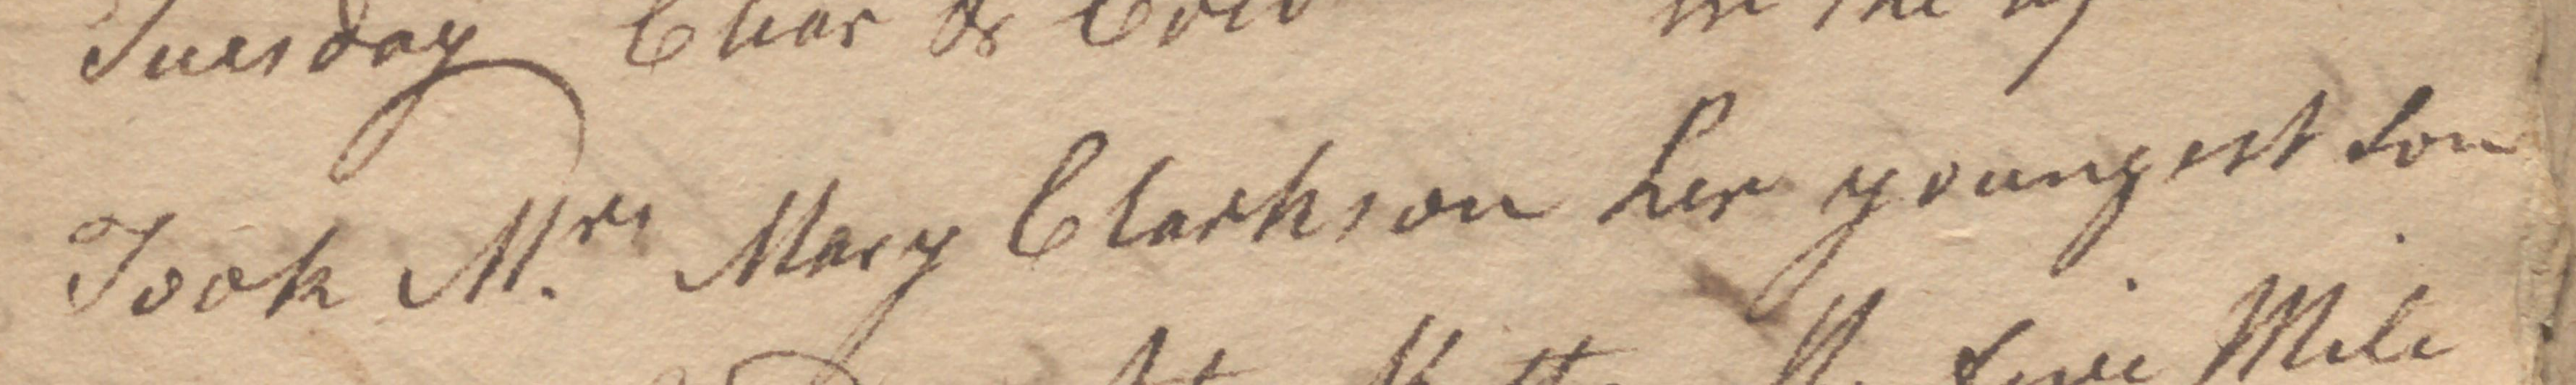Took M^rs. Mary Clarkson her youngest son
